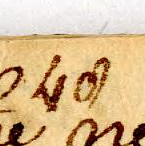48
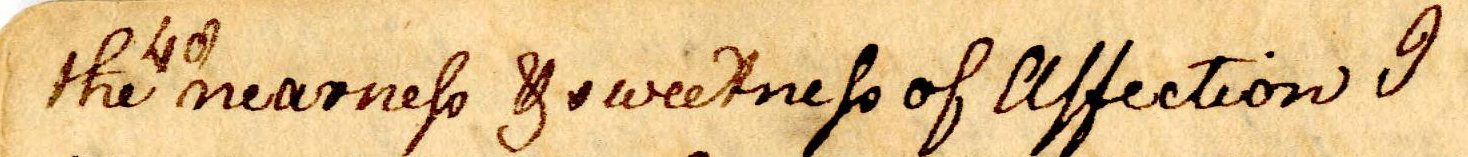the nearness & sweetness of Affection I
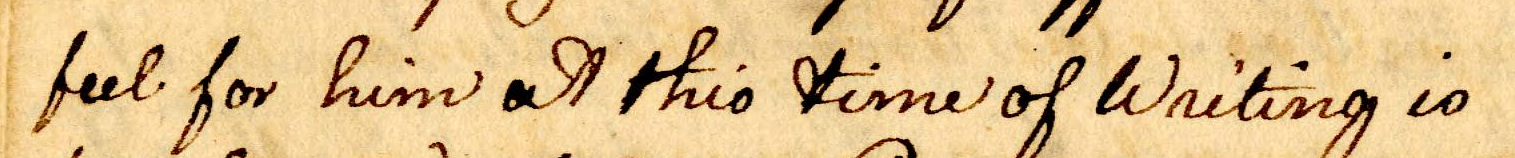feel for him at this time of Writing is
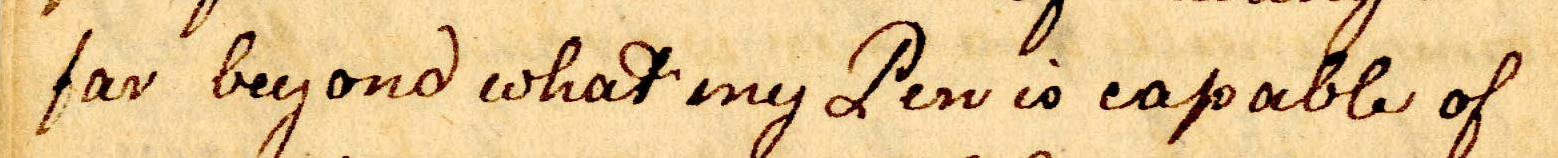far beyond what my Pen is capable of
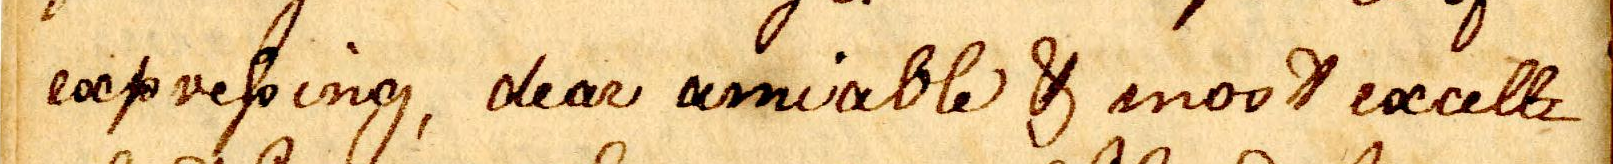expressing, dear amiable & most excell-
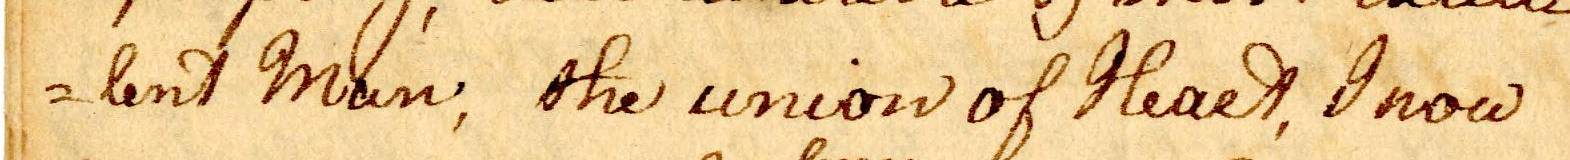-lent Man, the union of Heart, I now
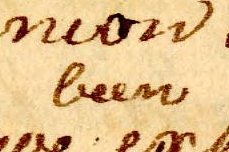been
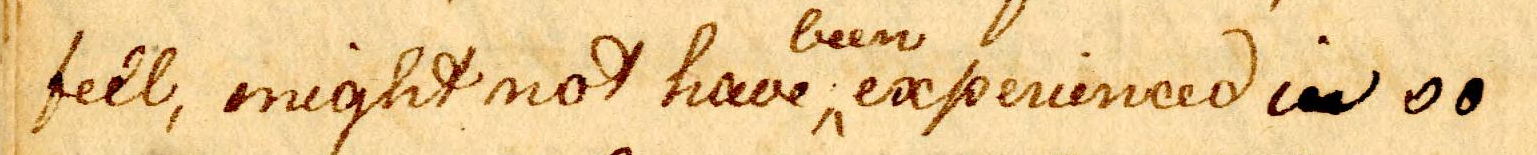fell, might not have ^been experienced in so
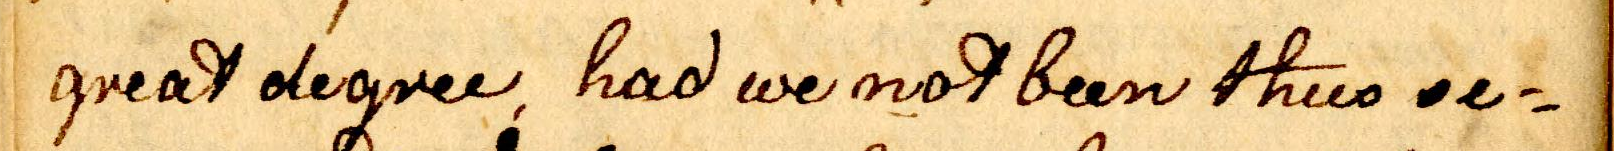great degree, had we not been thus se-
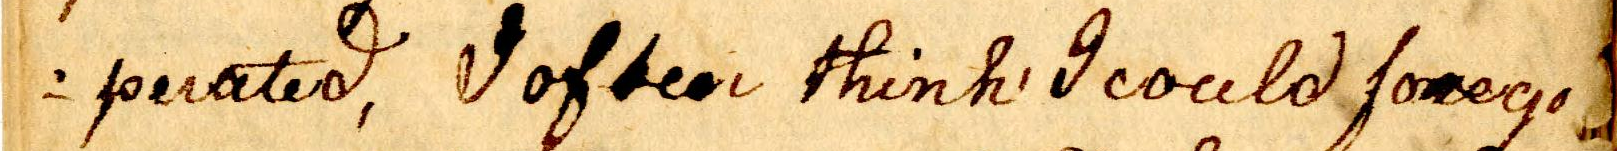-perated, I often think I could forego
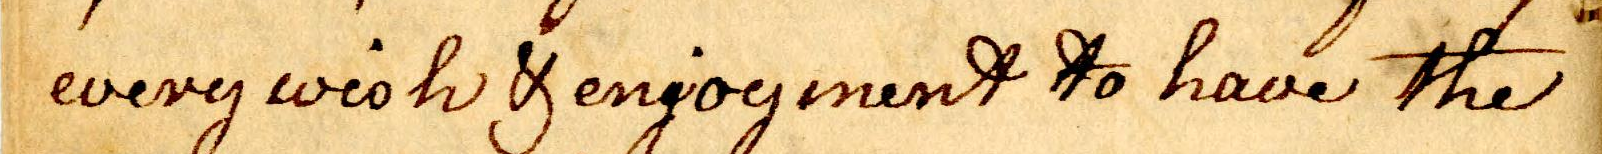every wish & enjoyment to have the
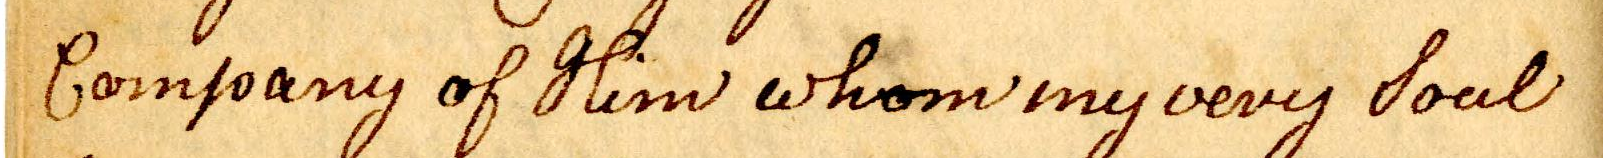Company of Him whom my very Soul
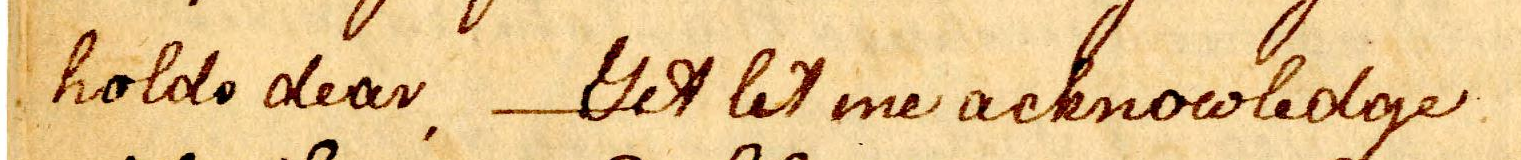holds dear,- Yet let me acknowledge
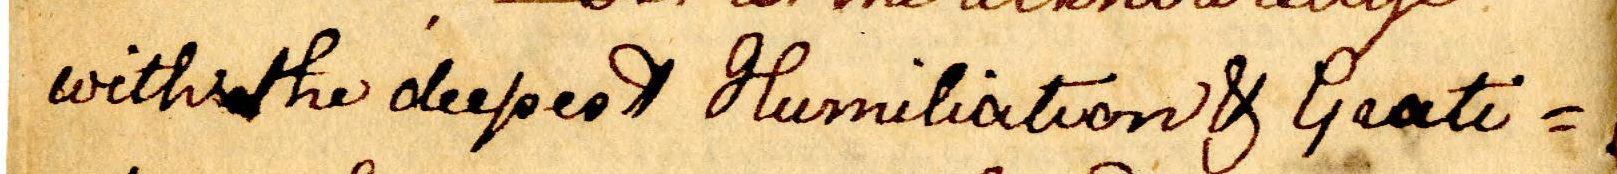with the deepest Humiliation & Grati-
